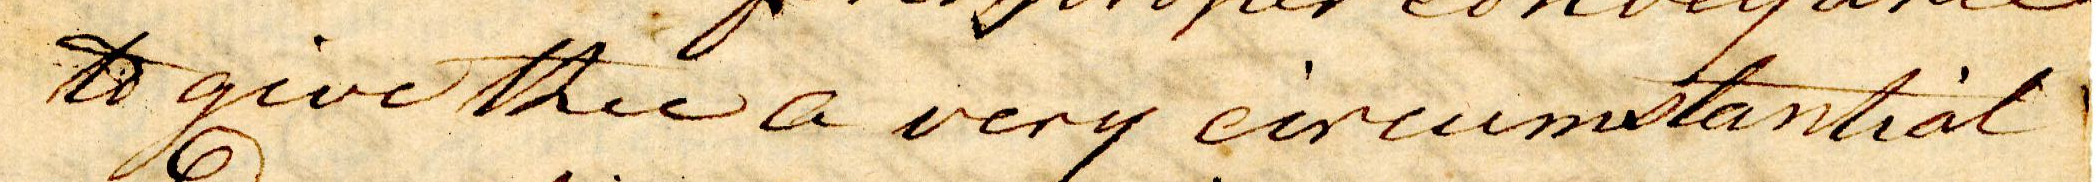to give thee a very circumstantial
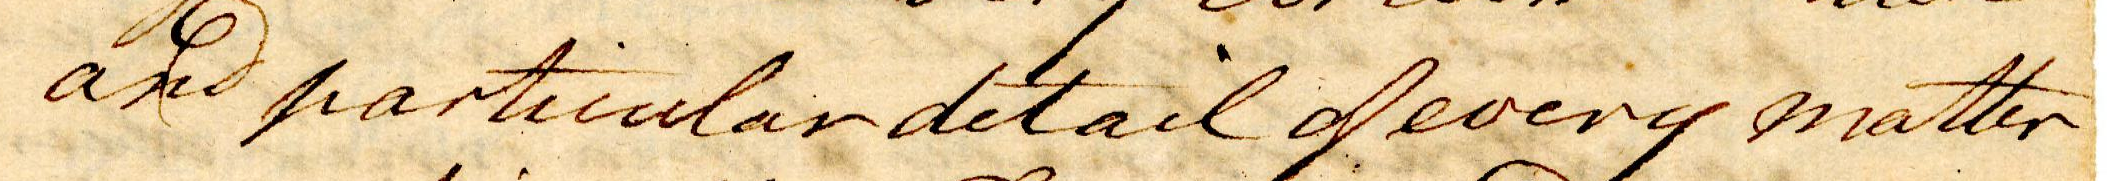and particular detail of every matter
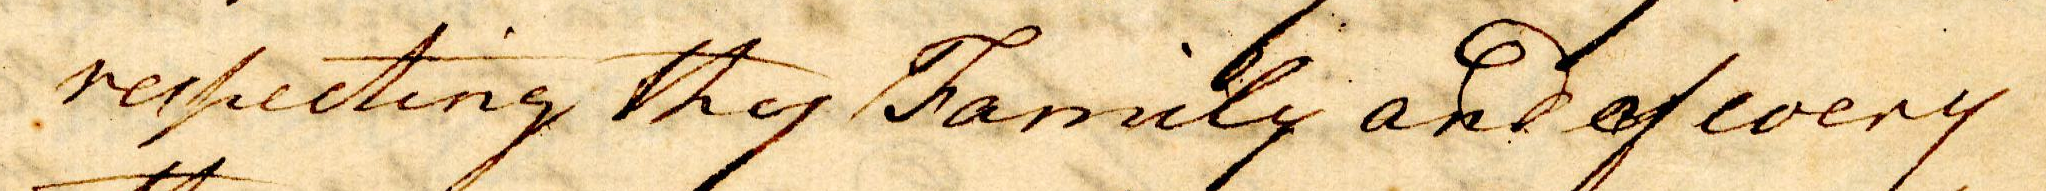respecting thy Family and of every
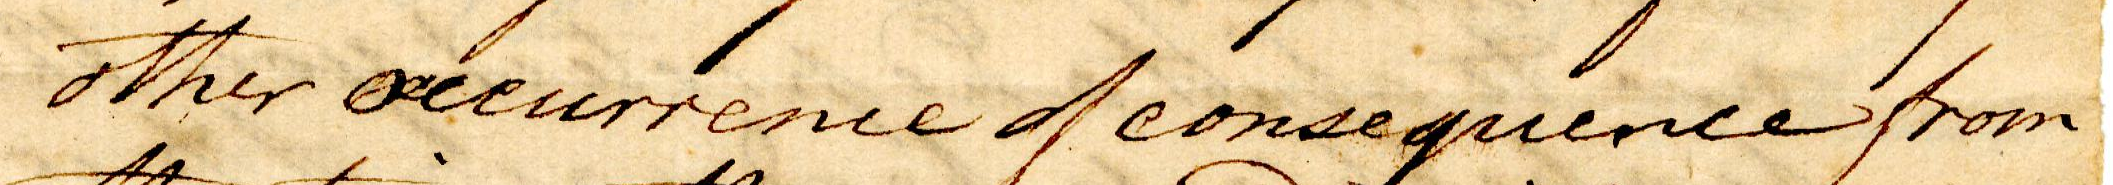other occurrence of consequence from
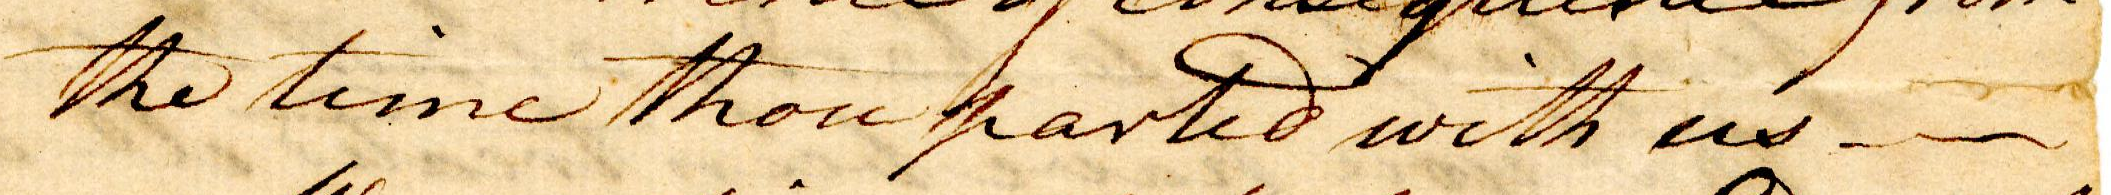the time thou parted with us.-
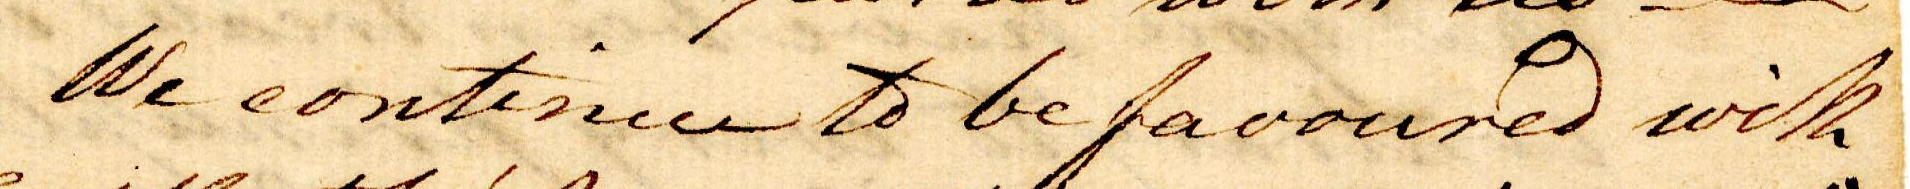We continue to be favoured with
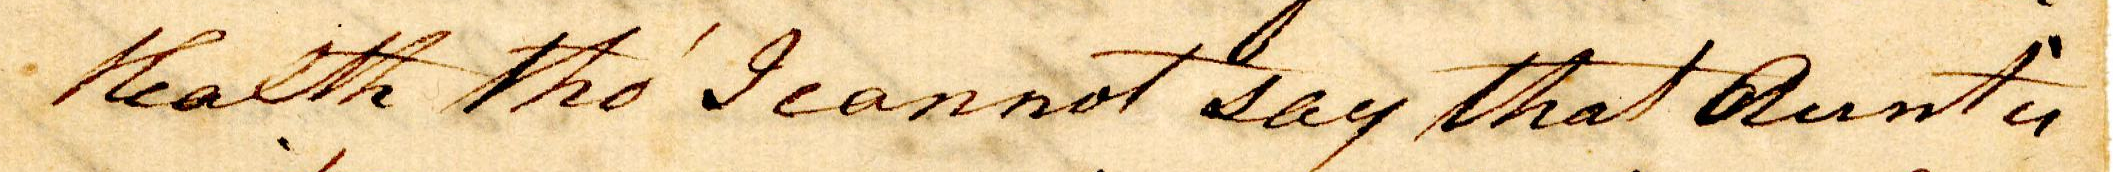Health tho' I cannot say that Aunt is
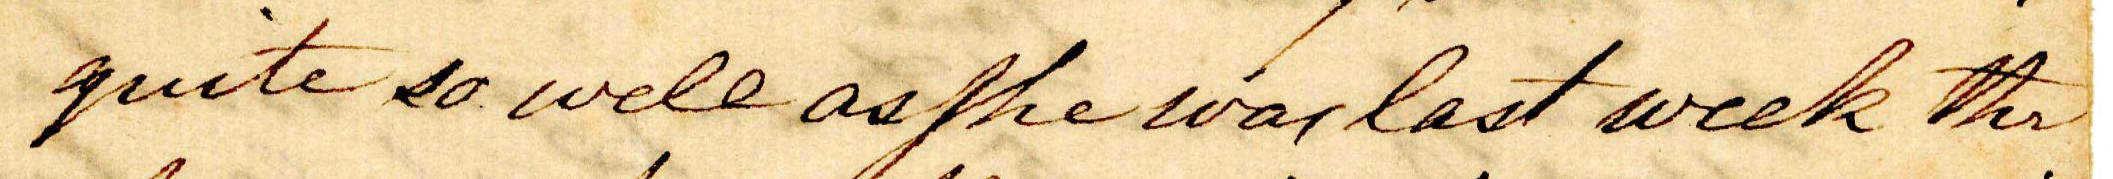quite so well as she was last week the
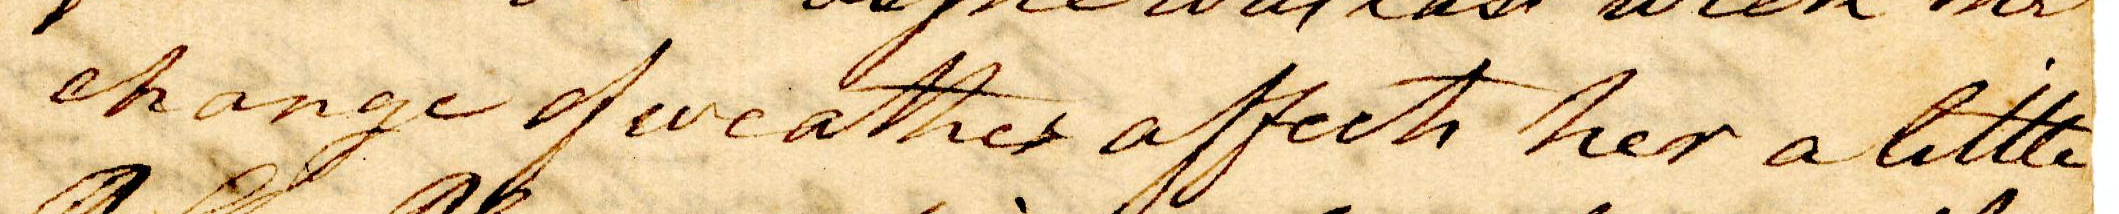change of weather affects her a little
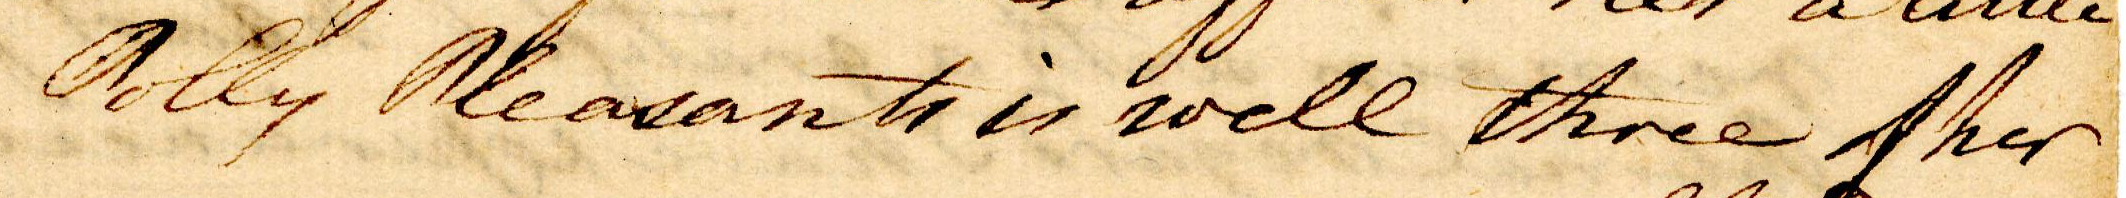Polly Pleasants is well three of her
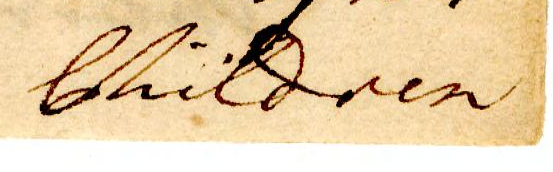children
